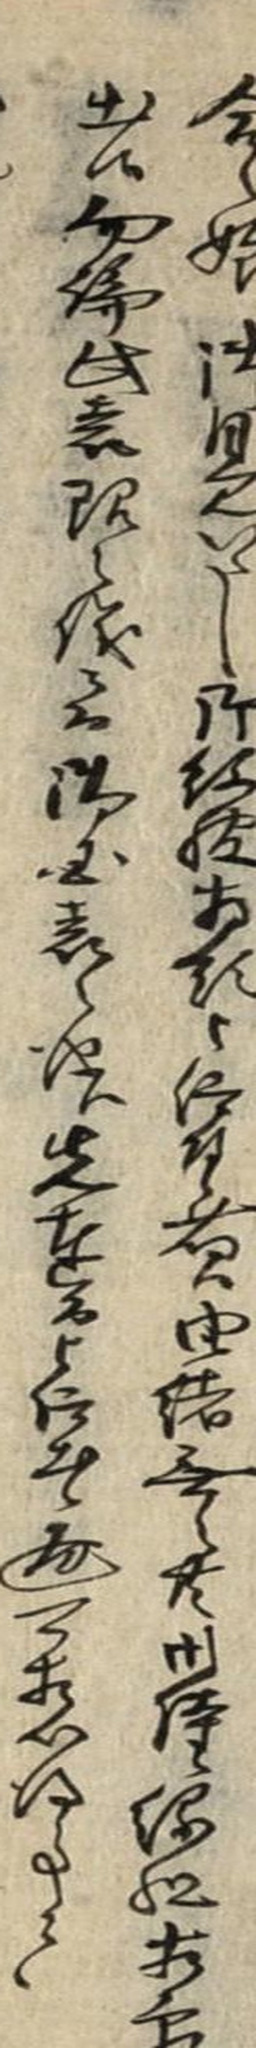出候勿論此表限之儀ニ而御国表之儀ハ先達而被仰出候通可相心得事ニ候
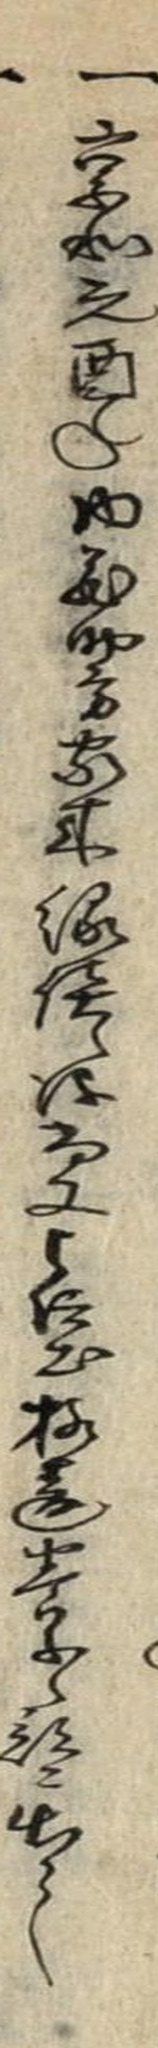一享和元酉年内蔵助方家来縁談之儀尚又被仰出格違養子之部ニ出之
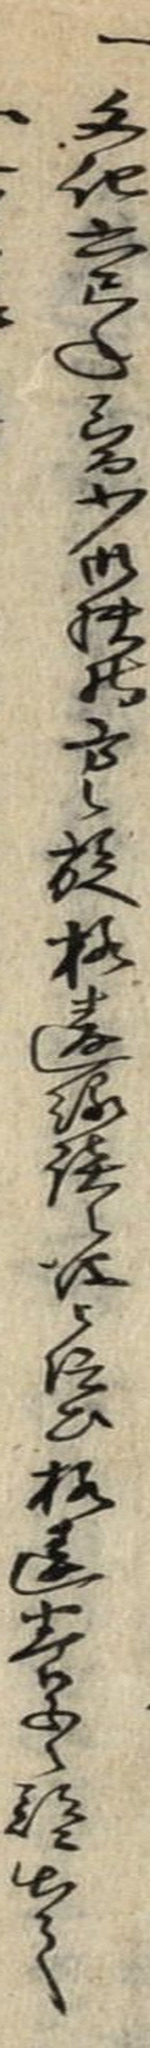一文化六巳年至而少御扶持方之族格違縁談之儀被仰出格違養子之部ニ出之
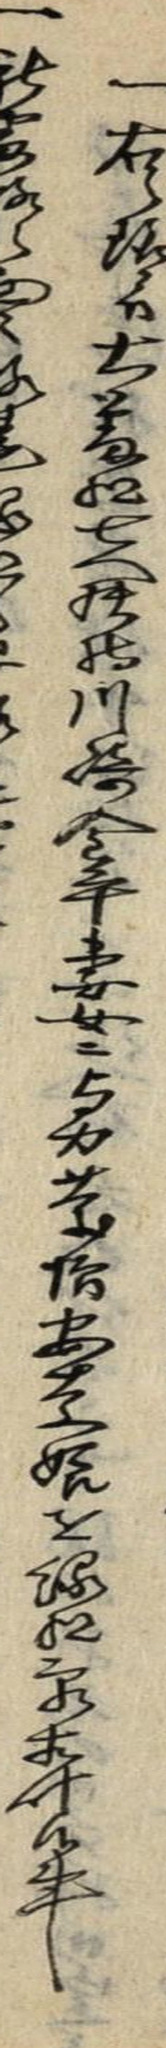一右之趣ニ付大御番組七人扶持川崎金平妻女ニ与力慶増安太夫娘を縁組願相叶候事
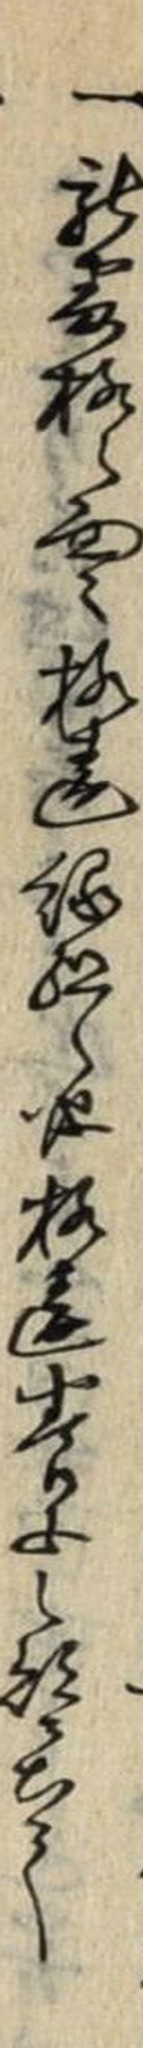一新番格之面々格違縁組之儀格違養子之部ニ出之
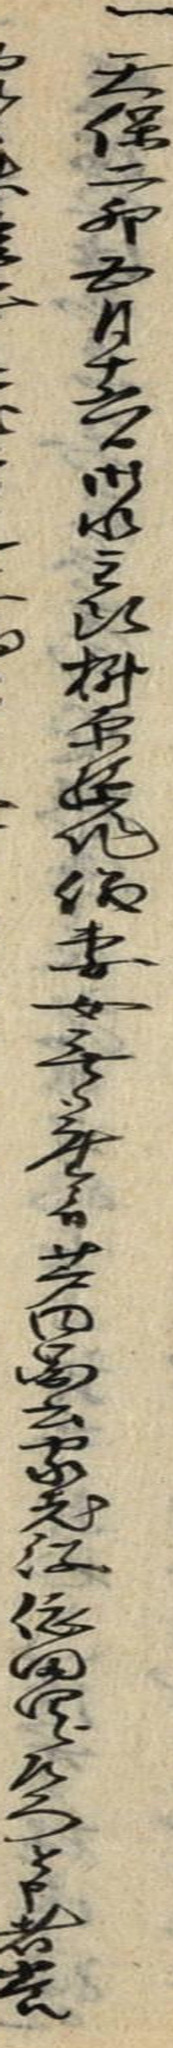一天保二卯正月十六日御水主頭榊原孫作儀妻女無之御座候ニ付芦田図書家老役依田四郎左衛門と申者養
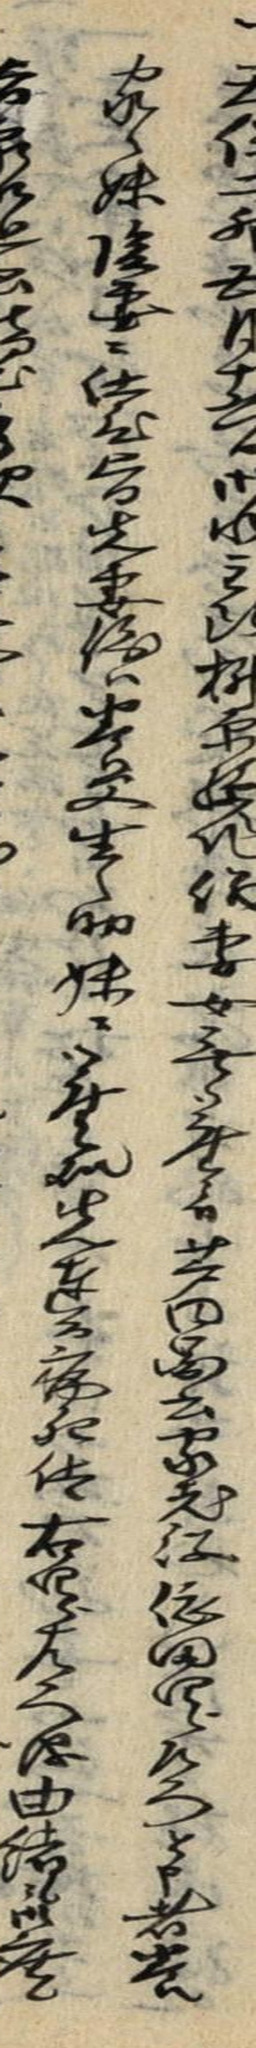家之妹後妻ニ仕度旨先妻儀ハ養父生之助妹ニ御座候処先達而病死仕候右四郎左衛門儀由緒も御座候
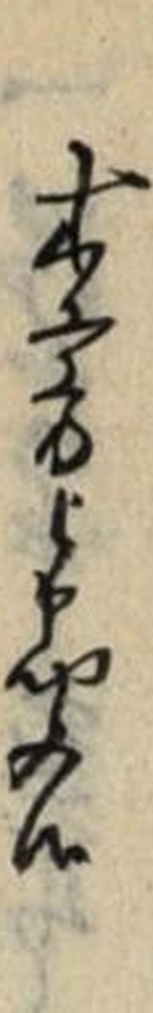木工方被申聞候
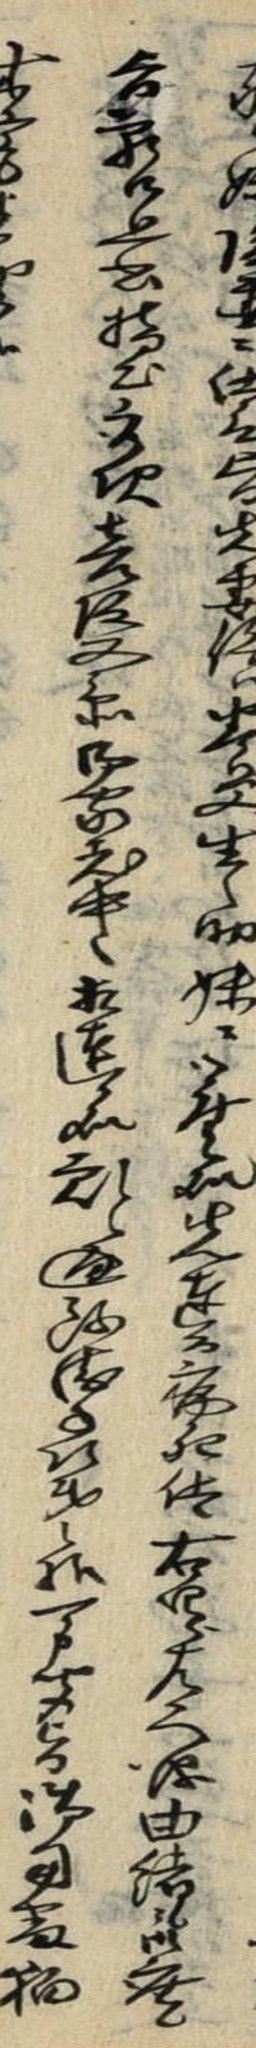旨願口上書指出取次彦坂又兵衛御家老中へ相達候処願之通致勝手次第候様可申聞旨御用番狛
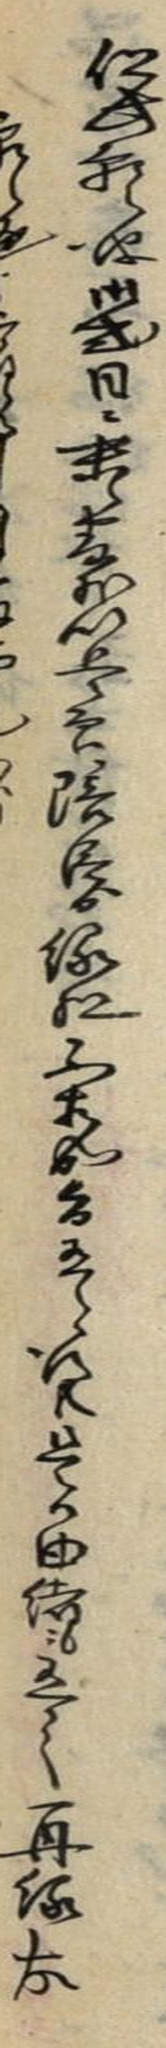但此願之儀御式目ニ末之番外以上ニ而ハ陪臣ゟ縁組不相成旨有之候得共是ハ由緒も有之再縁故
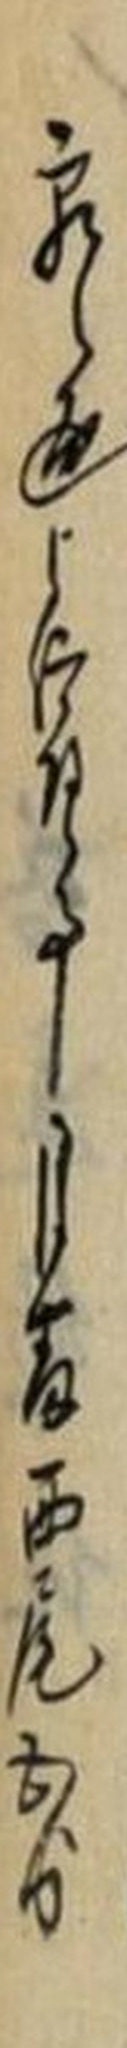願之通被仰付候事月番西尾五右衛門
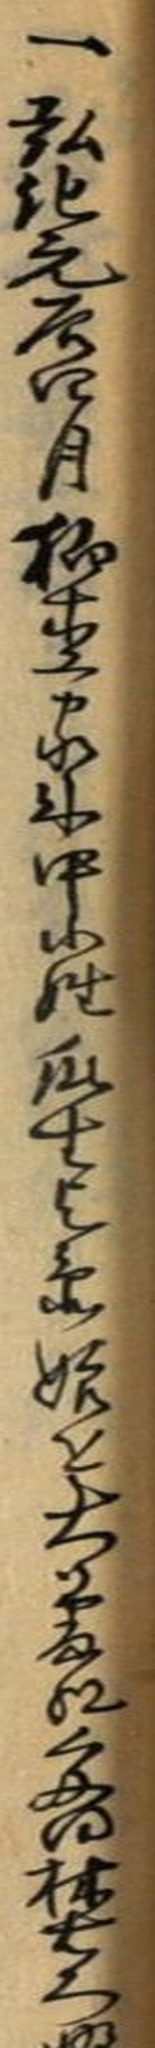一弘化元辰四月狛杢家来中小姓瓜生与兵衛娘を大御番組多田林右衛門倅久平太後妻ニ取迎候
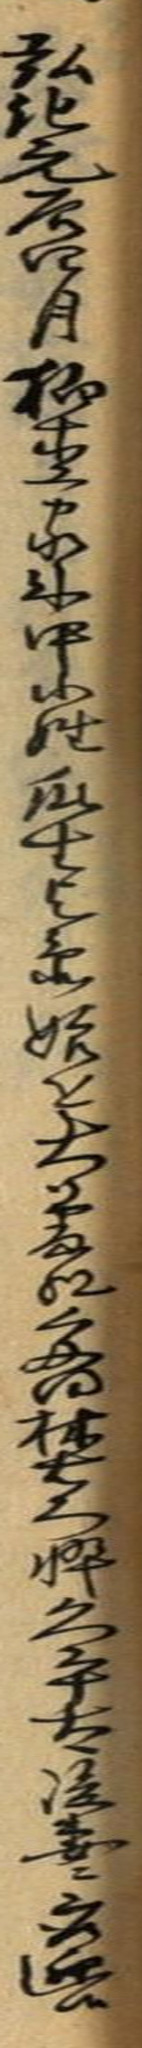一弘化元辰四月狛杢家来中小姓瓜生与兵衛娘を大御番組多田林右衛門倅久平太後妻ニ取迎候
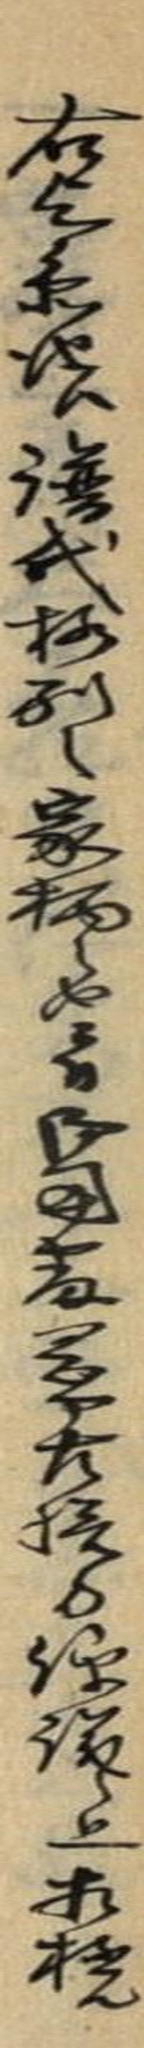右与兵衛儀ハ譜代格別之家柄之由ニ付御用番岡部左膳方評議之上相極ル
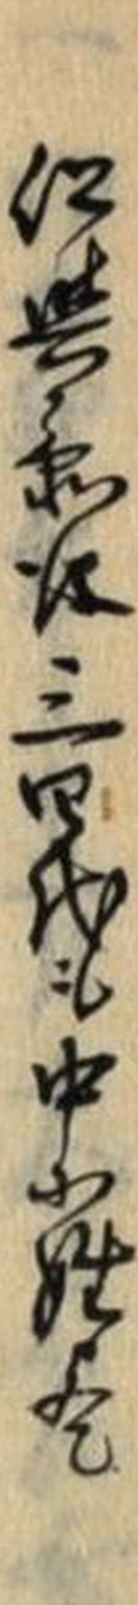但与兵衛儀三四代も中小姓歟
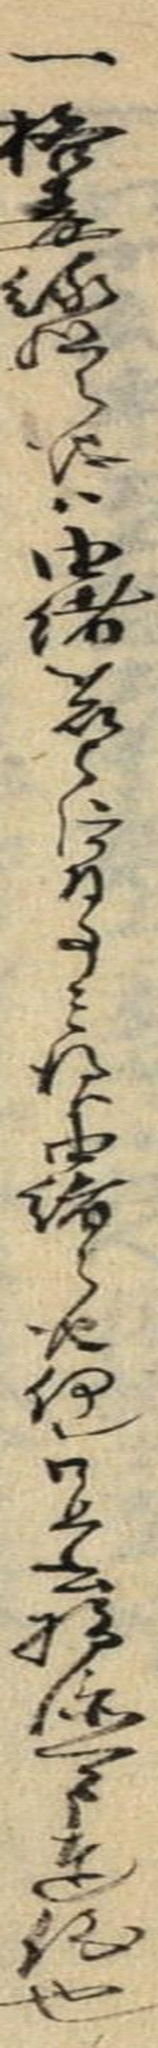一格違縁組之儀ハ由緒を以被仰付事ニ候得ハ由緒之儀何レ口上書指添可申達儀也
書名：養子縁組之部
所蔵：福井県文書館 Fukui Prefectural Archives
